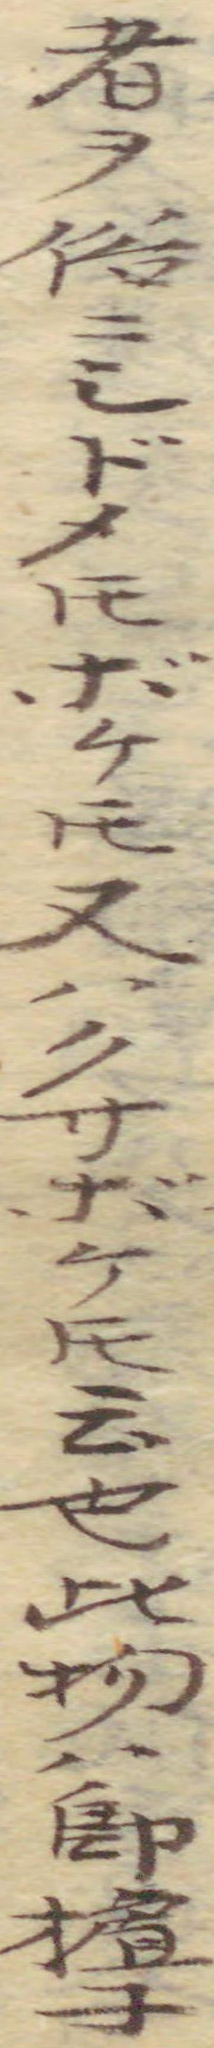者ヲ俗ニシドメトモボケトモ又ハクサボケトモ云也此物ハ即樝子
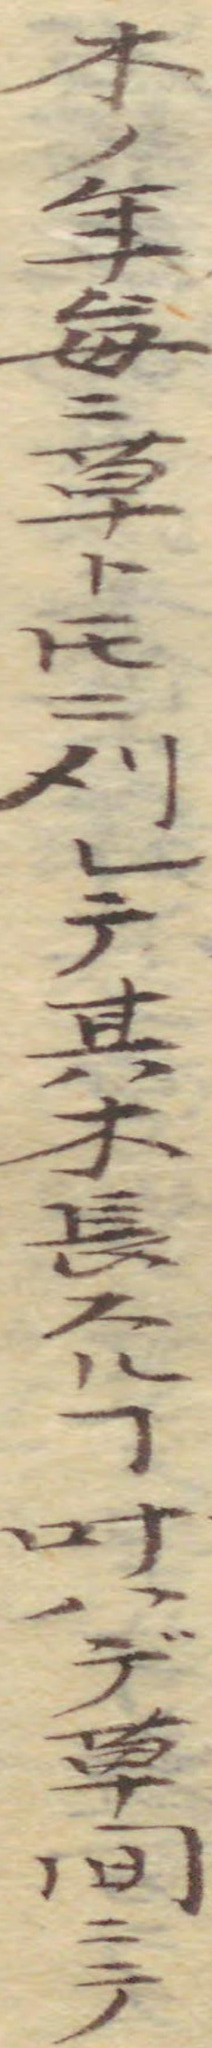木ノ年毎ニ草トトモニ刈レテ其木長スルコト叶ハデ草間ニテ
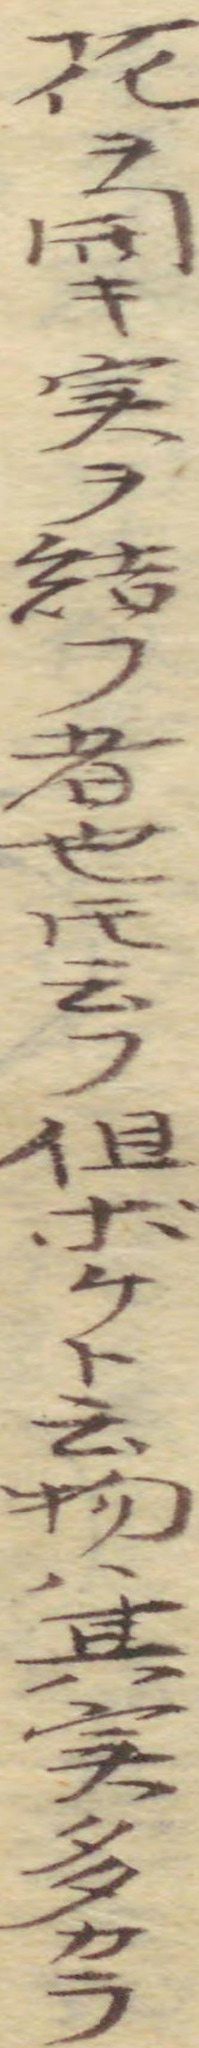花ヲ開キ実ヲ結フ者也トモ云フ但ボケト云物ハ其実多カラ
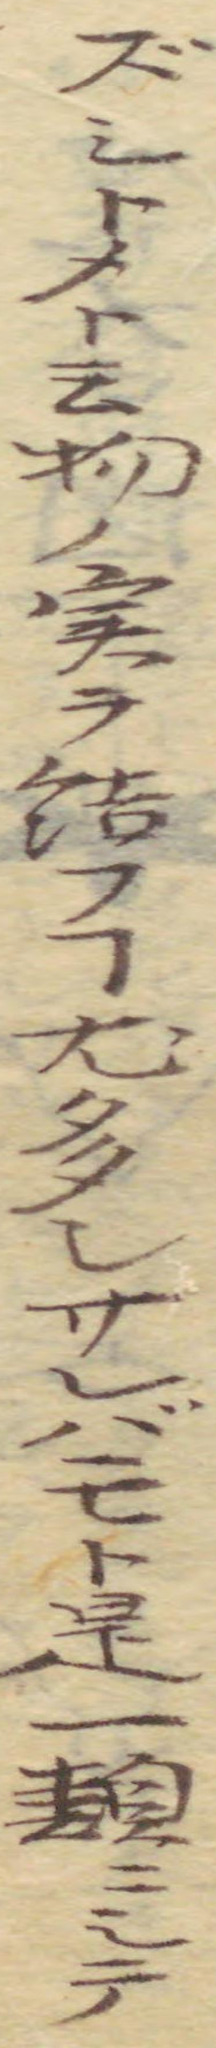ズシトメト云物ノ実ヲ結フコト尤多シサレバモト是一類ニシテ
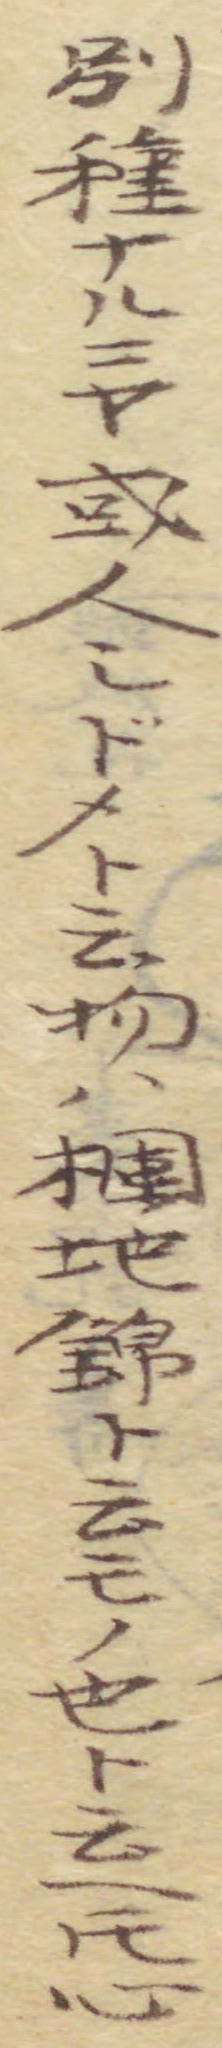別種ナルニヤ或人シドメト云物ハ欄地錦ト云モノ也ト云ヘトモ心
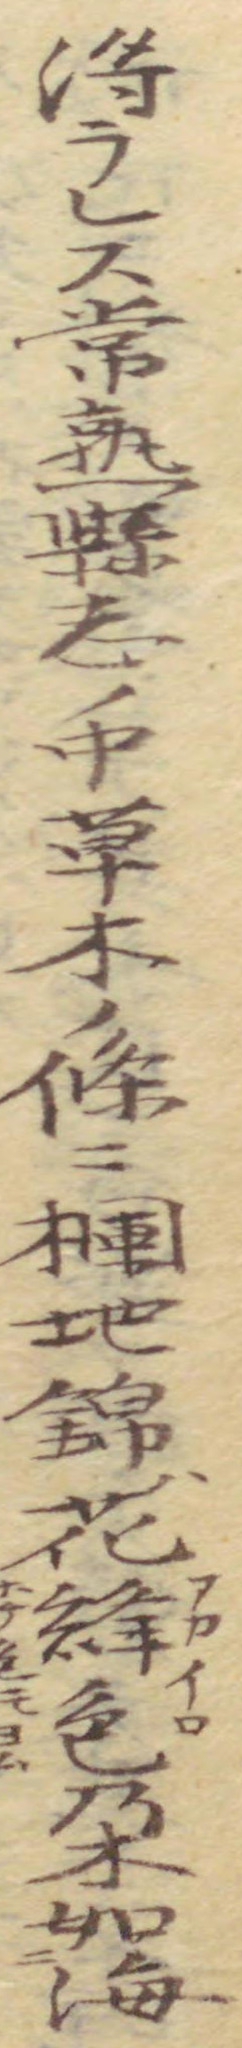得ラレス常熟県志ノ中草木ノ條ニ欄地錦ハ花絳色朶如海
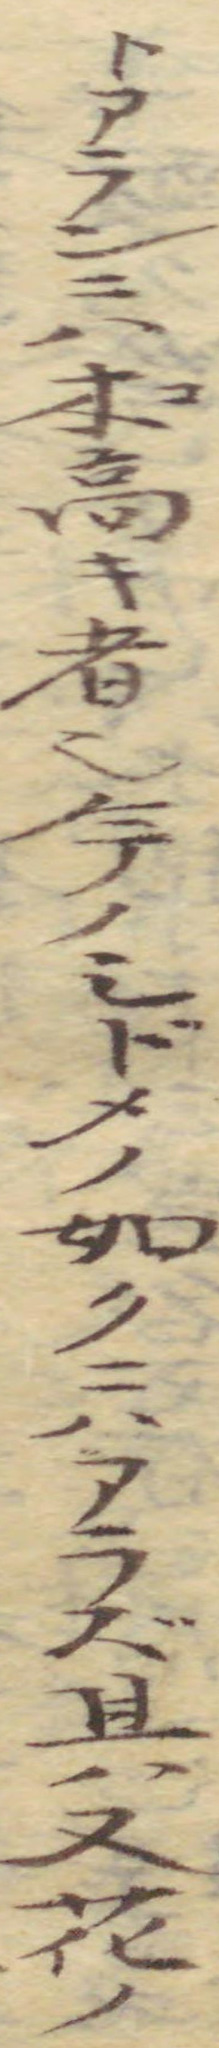トアランニハ木高キ者也今ノシドメノ如クニハアラズ且ハ又花ノ
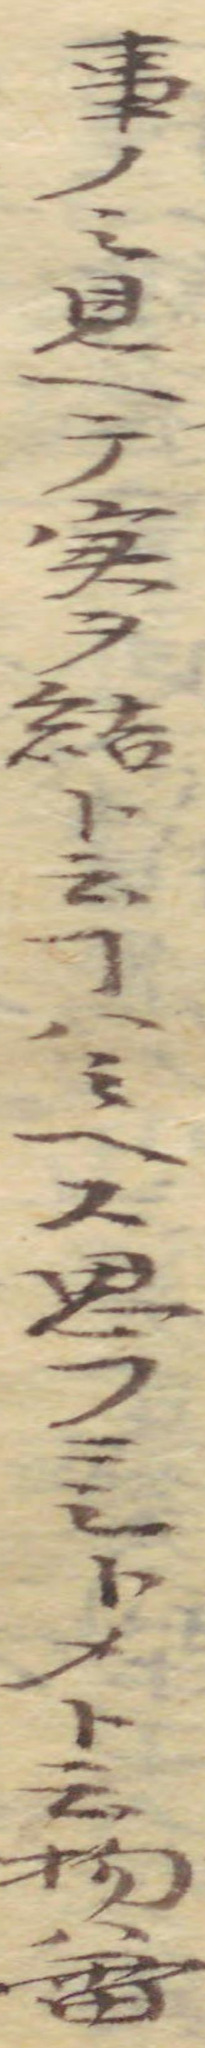事ノミ見ヘテ実ヲ結ト云コトハミヘス思フニシトメト云物ハ雷
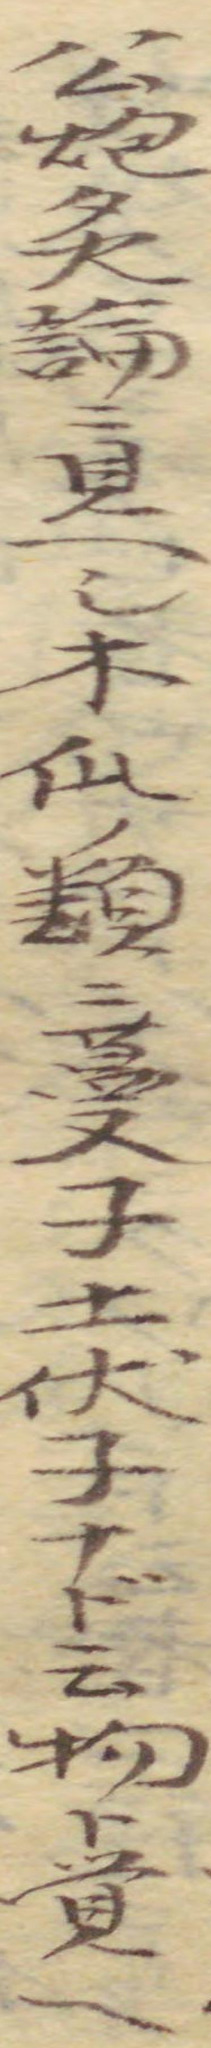公炮炙論ニ見ヘシ木瓜ノ類ニ蔓子土伏子ナド云物ト覚ヘ
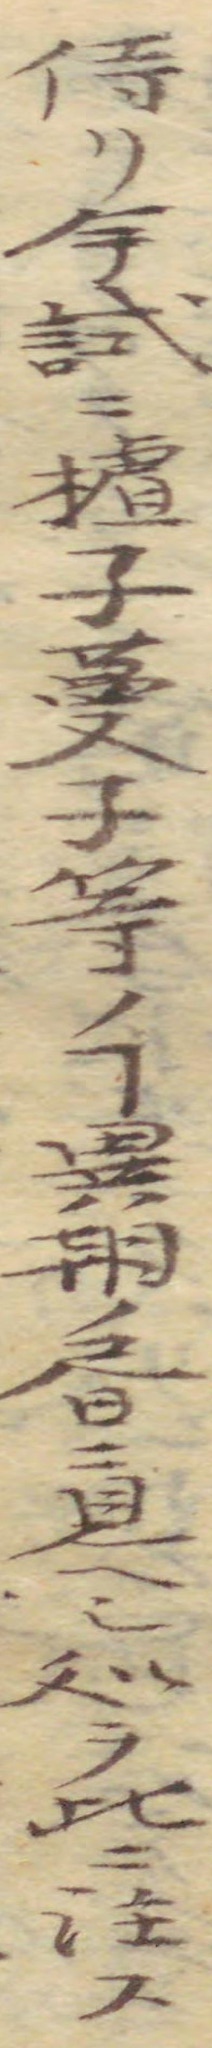侍リ今試ニ樝子蔓子等ノコト異朝ノ書ニ見ヘシ処ヲ此ニ注ス
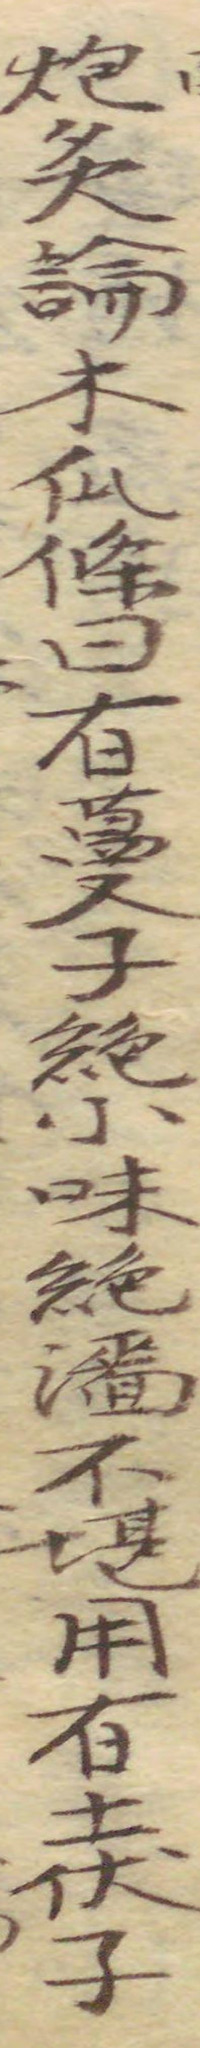炮炙論木瓜條曰有蔓子絶小味絶濇不堪用有土伏子

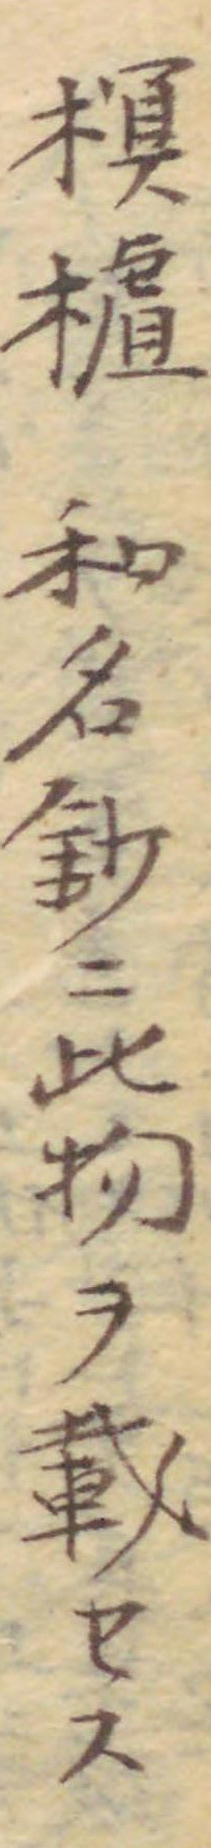榠樝和名鈔ニ此物ヲ載セス
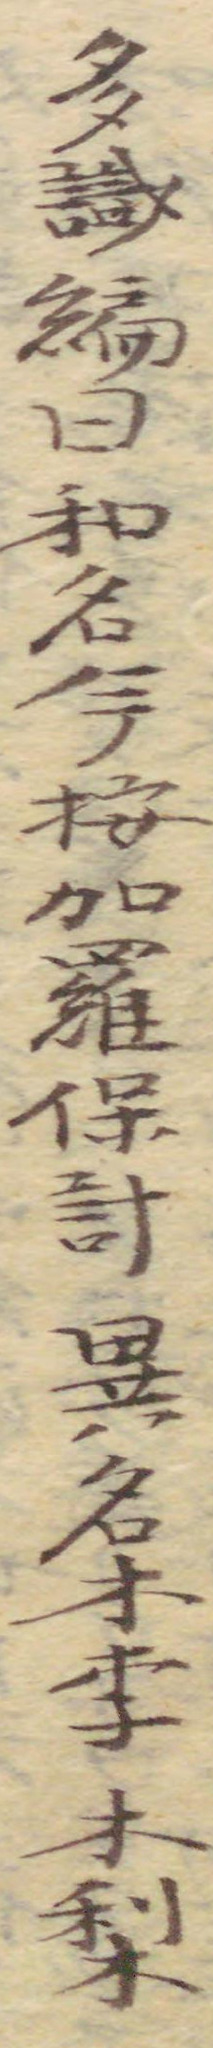多識編曰和名今按加羅保計異名木李木梨
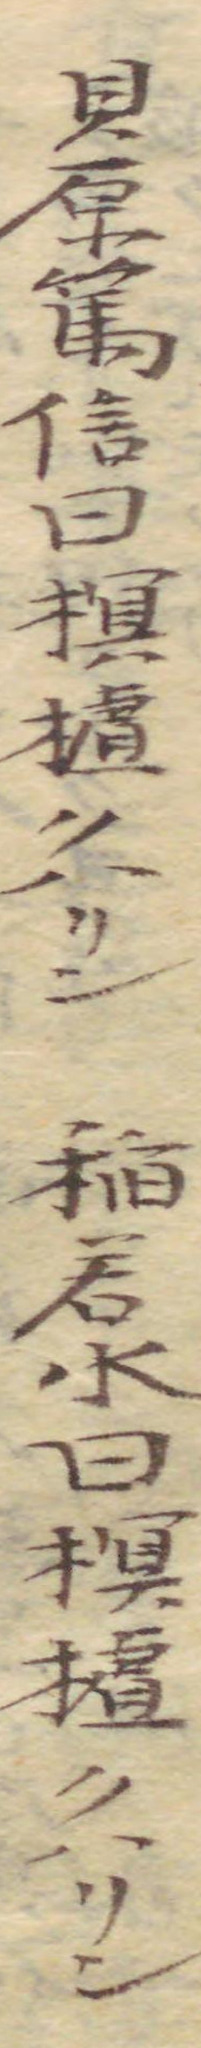貝原篤信曰榠樝クハリン稲若水曰榠樝クハリン
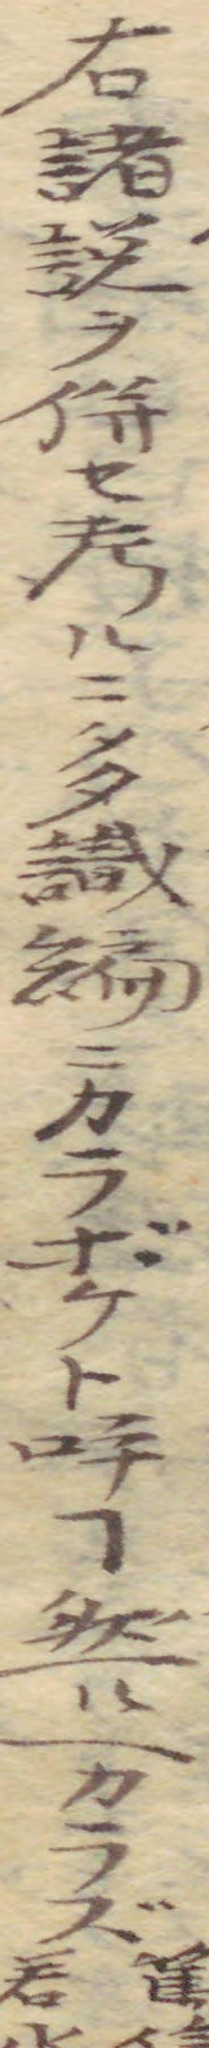右諸説ヲ併セ考ルニ多識編ニカラボケト呼コト然ルヘカラズ篤信若水
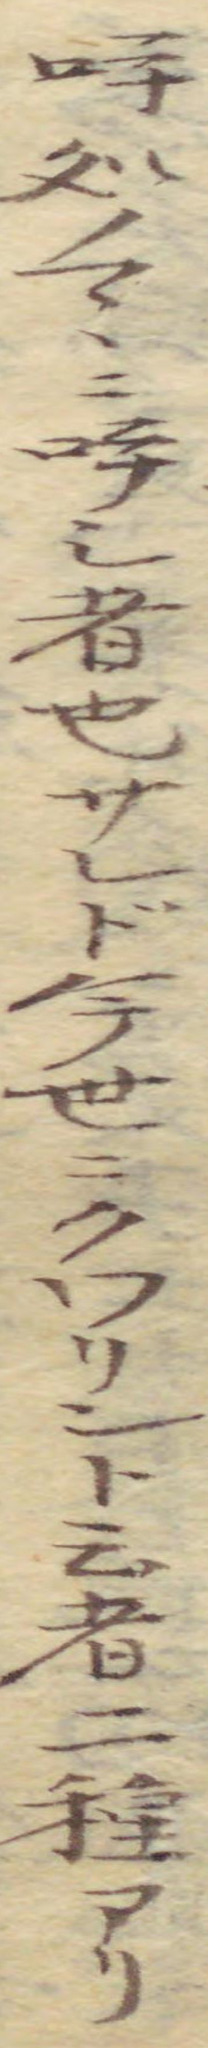呼処ノマヽニ呼シ者也サレド今世ニクワリント云者二種アリ
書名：鶯宿雑記. 巻263-264
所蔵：国立国会図書館 National Diet Library, JAPAN
